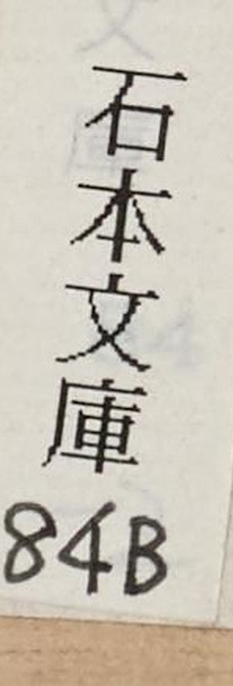石本文庫

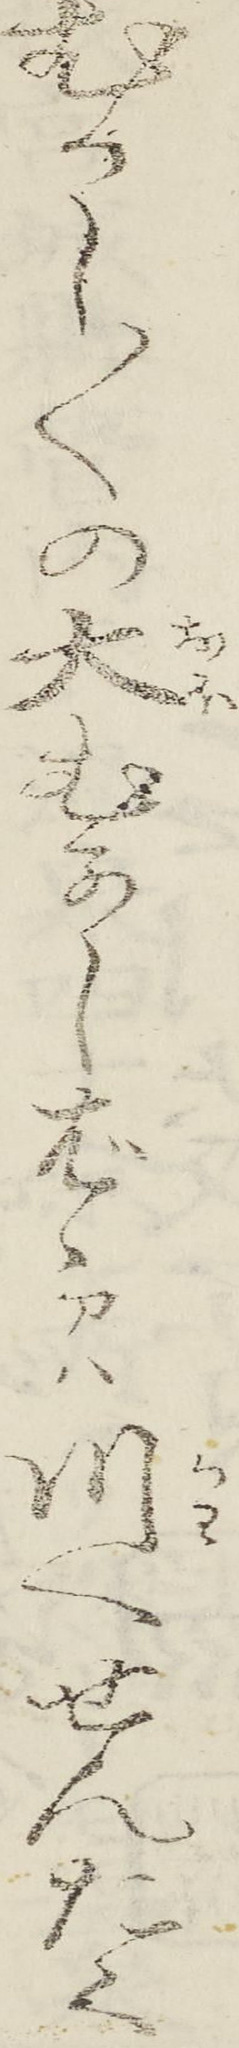むかし〳〵の大むかしばゝアは川へせんたく
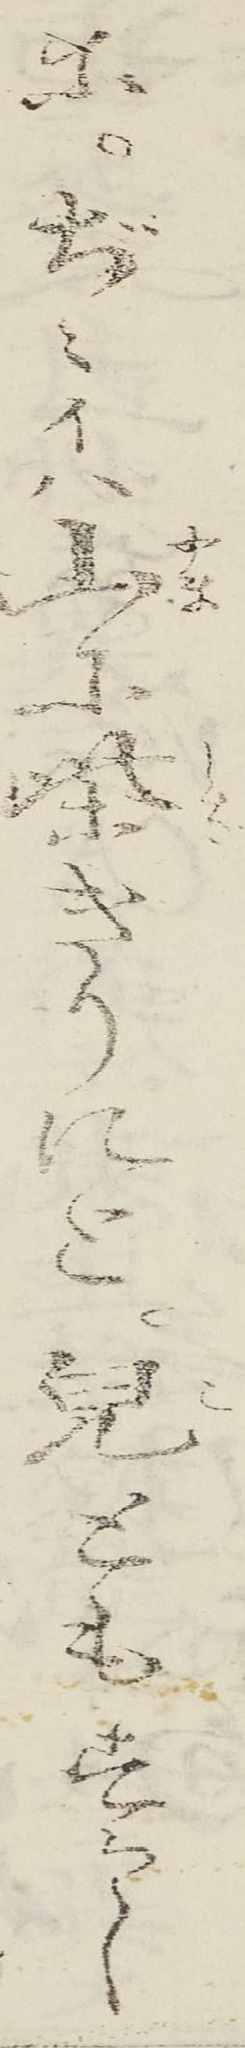に。ぢゝイは山に柴きりにと。児ともすかし
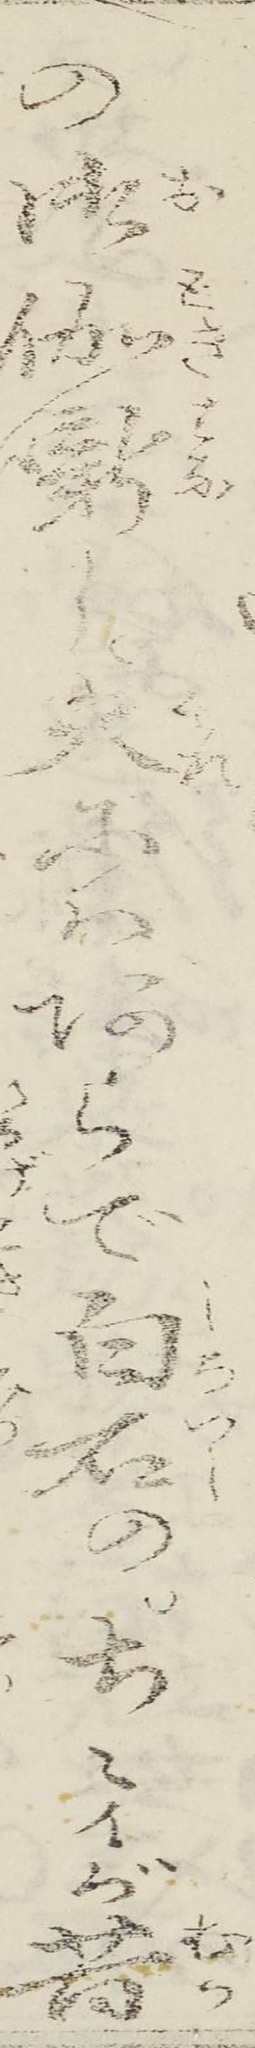の御伽噺し。夫にはあらで白石の。ちゝイが昔
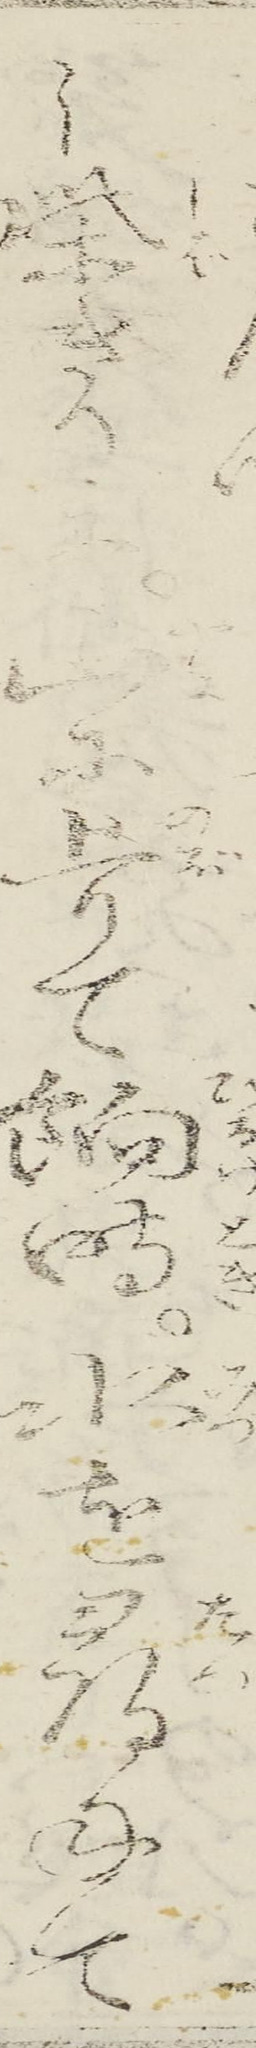し柴きりに。山に上りて餉時。水を尋ねて
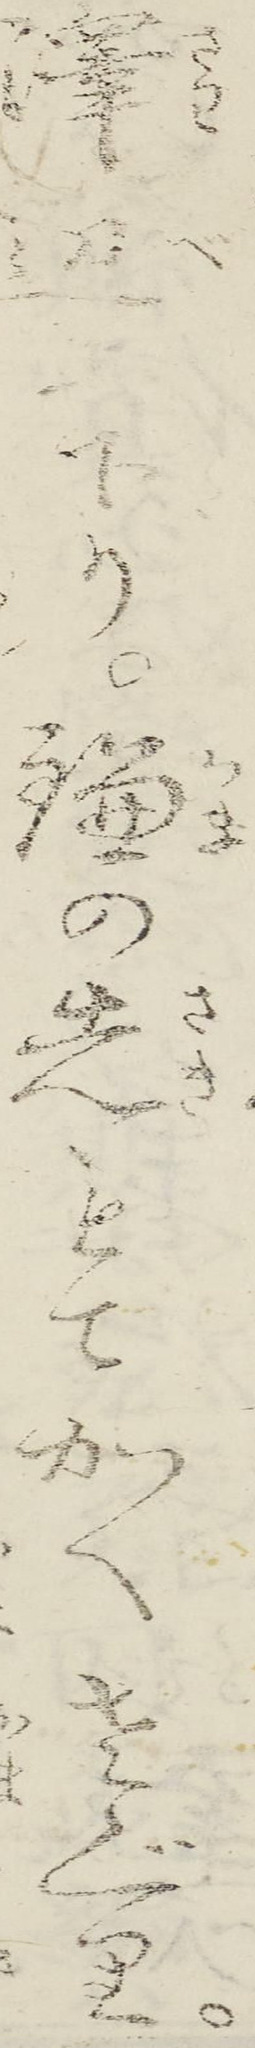沢辺に下り。鎌の先もてかへさぐり。
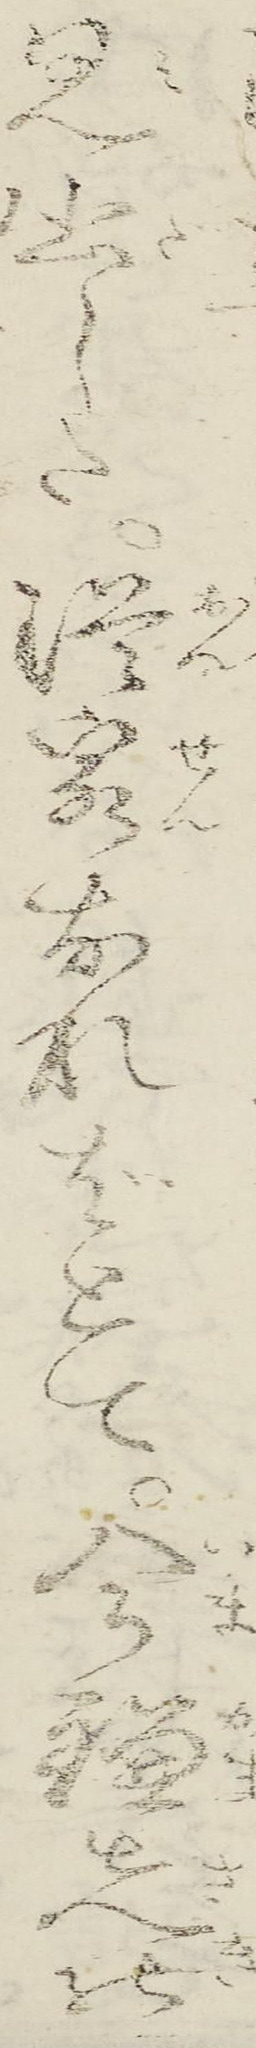見出した。温泉なればとて。今鎌先の
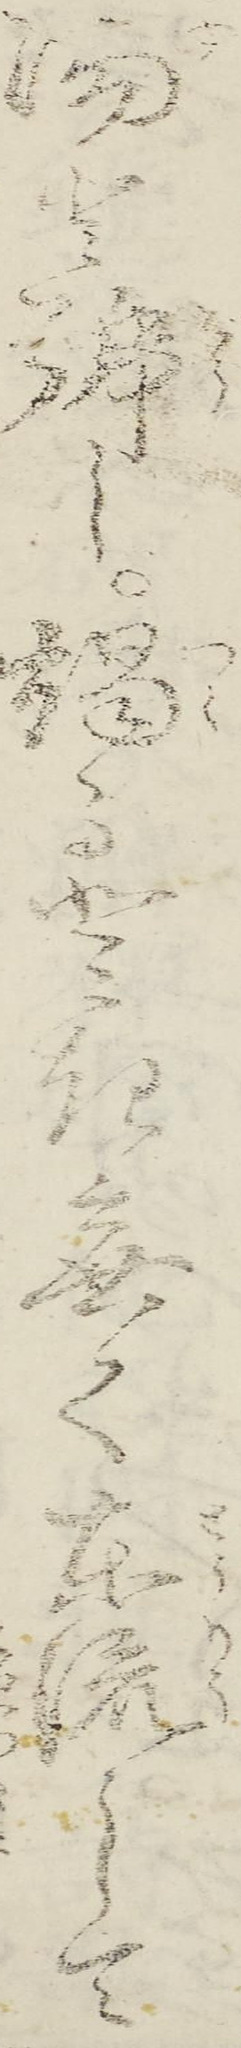湯と号し。竭るとき無く東流して
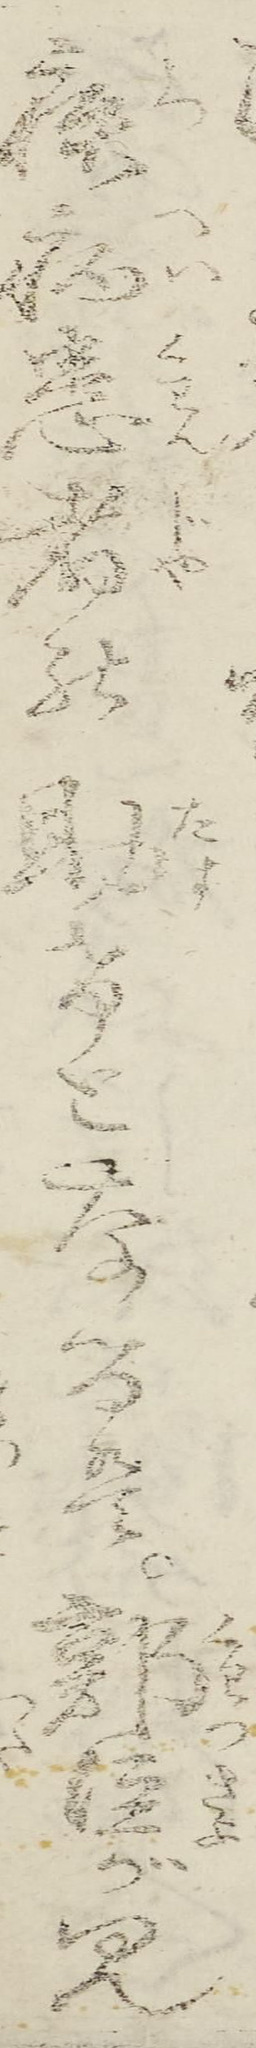疾病患者の助けとなるは。郭巨が見
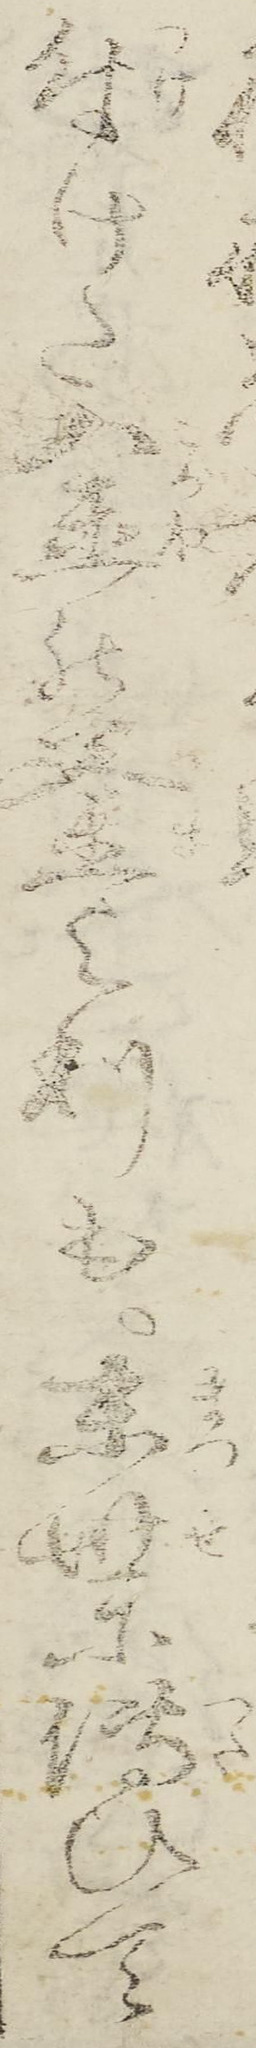付けた金の釜よりも。末世に伝ひて

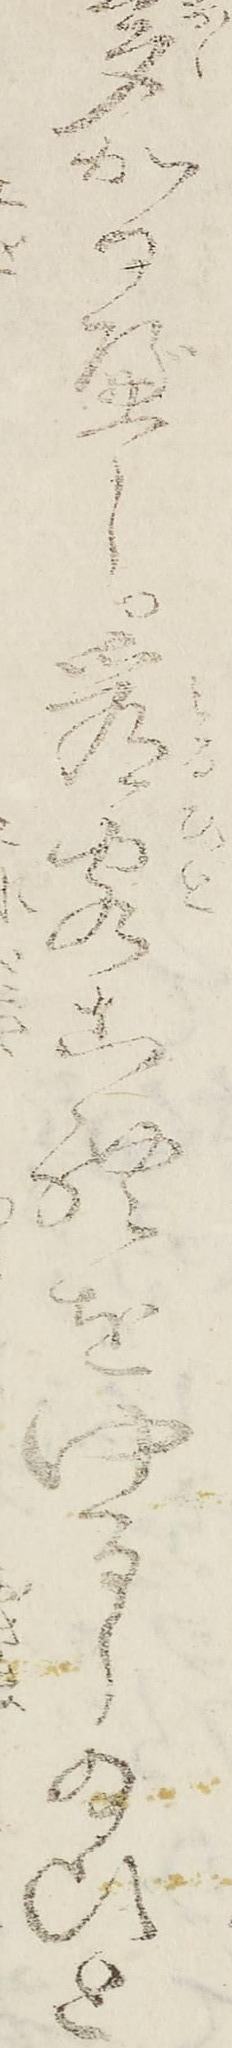多かるべし。爰家これをゆるし給ひと
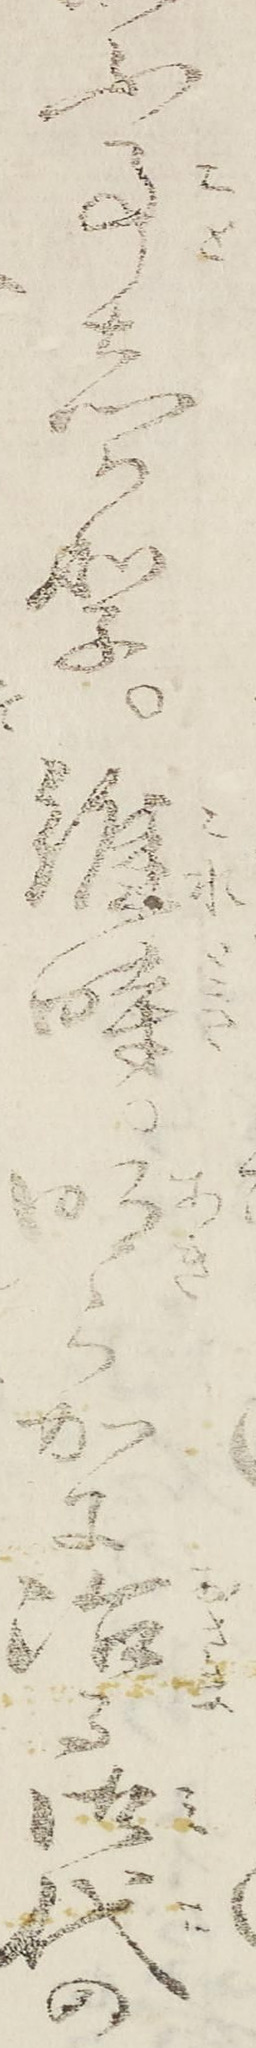いふ事しかり。維時。明らかに治る御代の
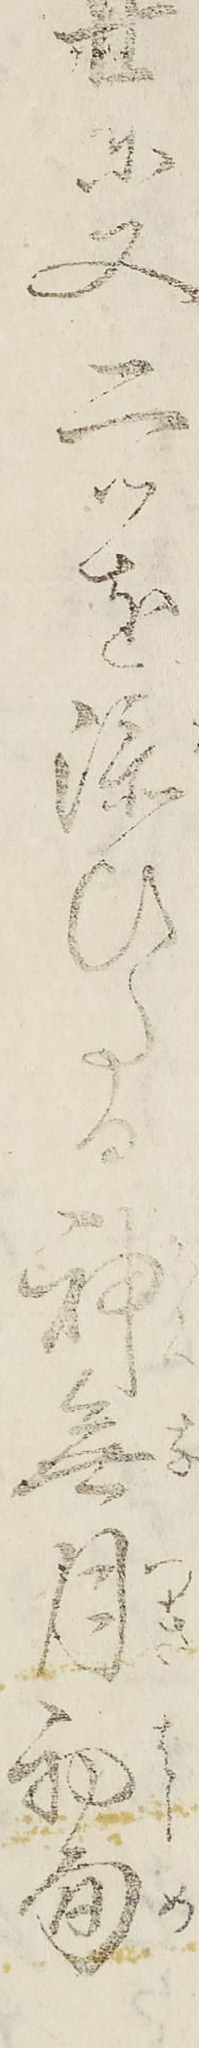廿に又二ツを添ひたる神無月初旬
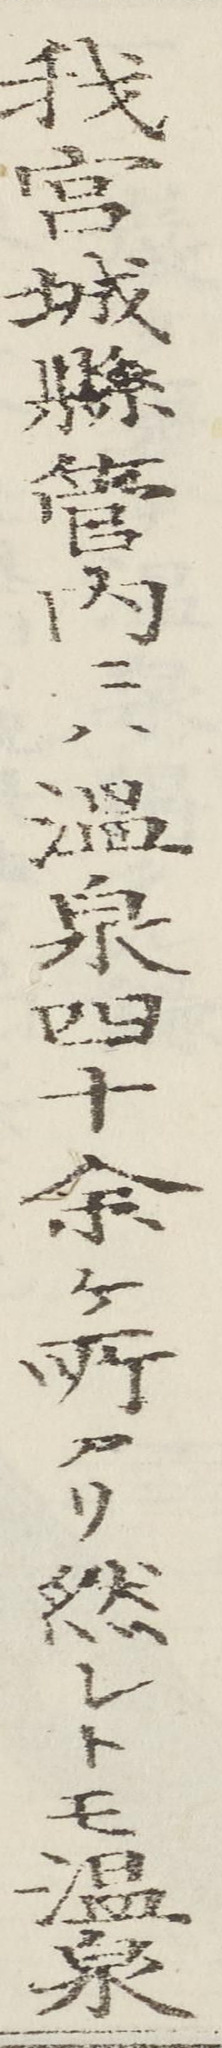我宮城県管内ニハ温泉四十余ケ所アリ然レトモ温泉
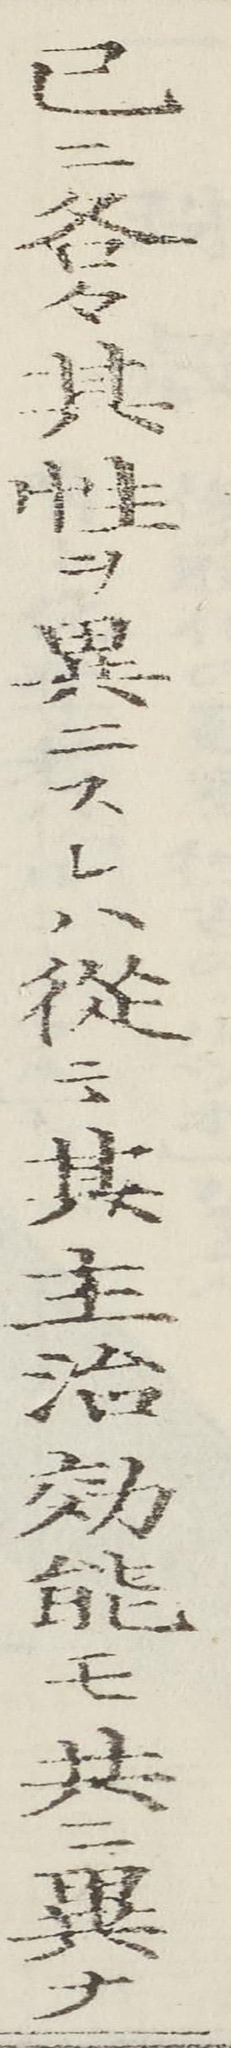已ニ各々其性ヲ異ニスレハ従テ其主治効能モ共ニ異ナ
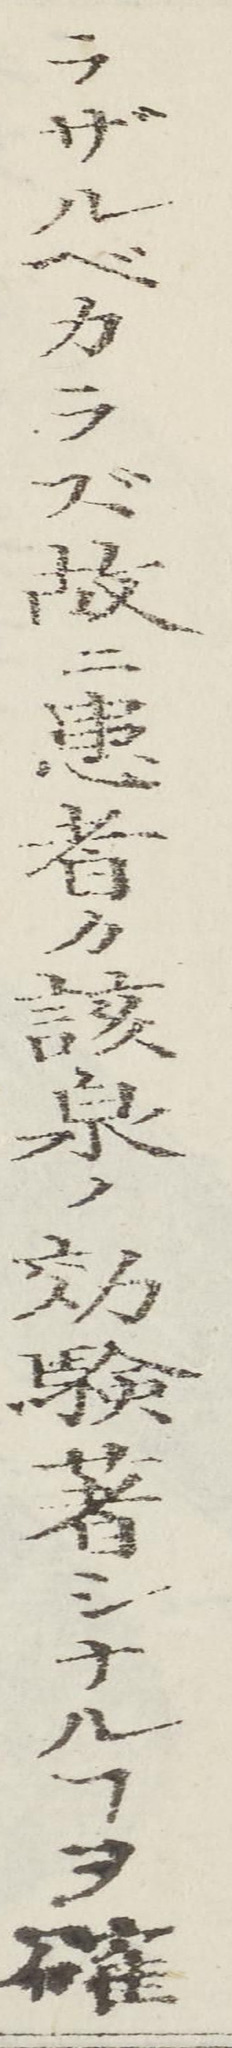ラザルベカラズ故ニ患者ガ該泉ノ効験著シタルコトヲ確
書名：鎌先温泉由來記
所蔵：東京大学地震研究所図書室 Earthquake Research Institute Library, The University of Tokyo, JAPAN
